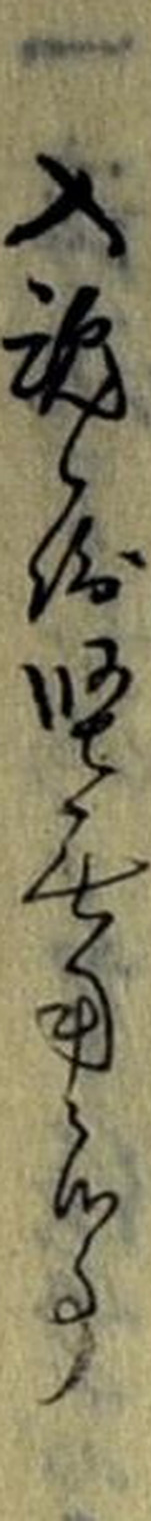入魂候儀堅無用ニ候事

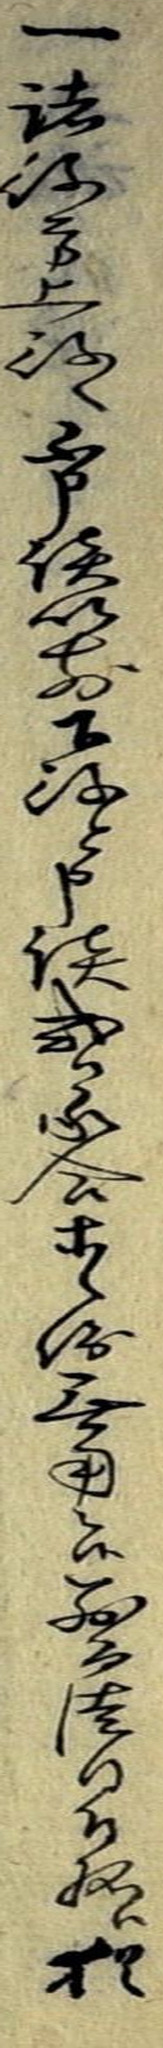一緒役方上役へ不申談以前下役と申談或ハ承合等之儀無用ニ候別而徒目付抔ハ猶
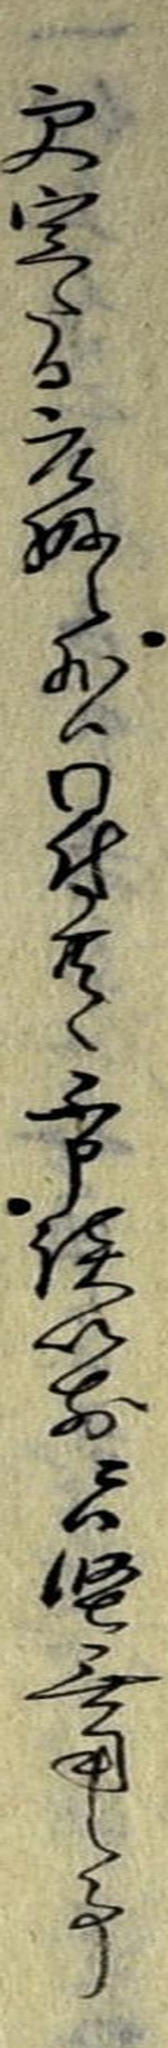更定たる取扱之外ハ目付共へ不申談以前ニハ堅無用之事
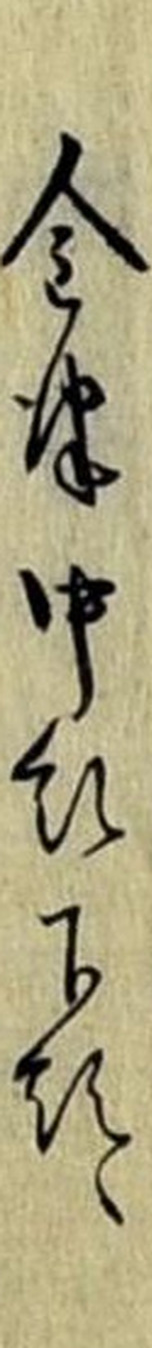金津中領下領へ
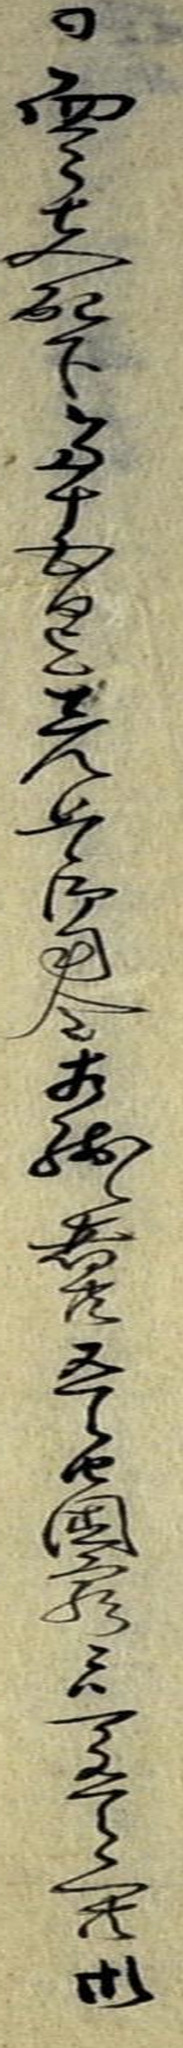〇面々支配下当十五日迄差上候御用金相残候者共有之由困窮ニハ可有之候へ共御
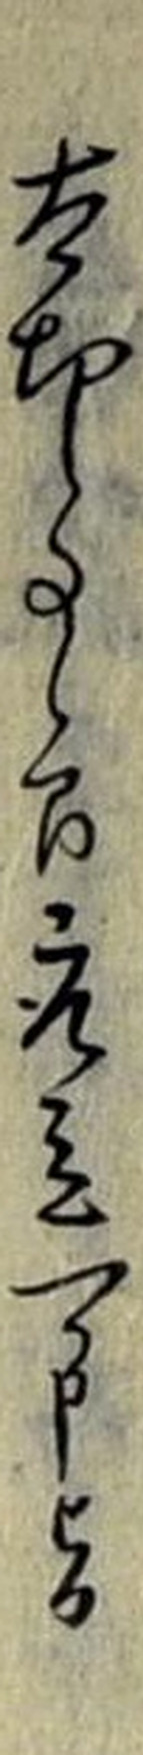太切之事候間取立可申旨
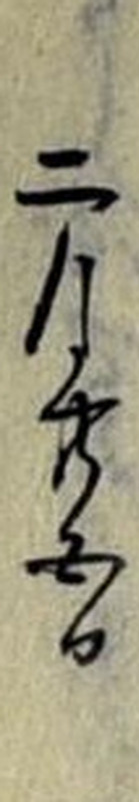二月廿五日
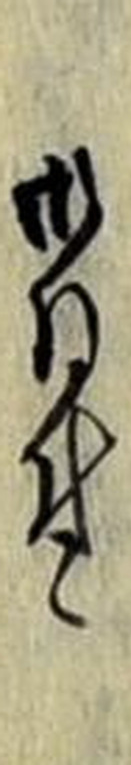御目付へ
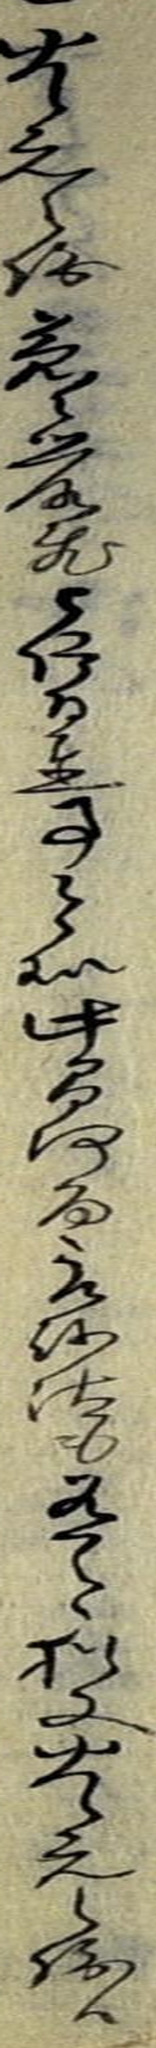〇火之元之儀兼々厳敷被仰付置事ニ候処此間何角取沙汰も有之候猶又火之元之儀ハ
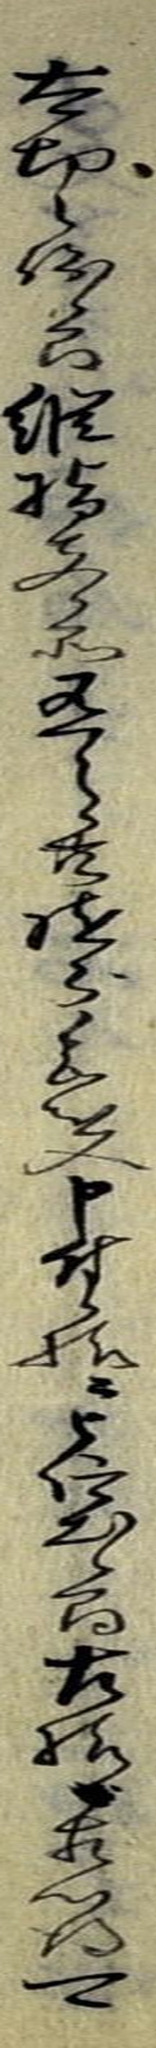太切之儀候間縦指支候品有之候共随分念を入申付候様ニ被仰出候間左様被相心得可
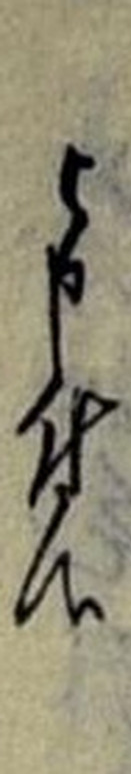被申付候
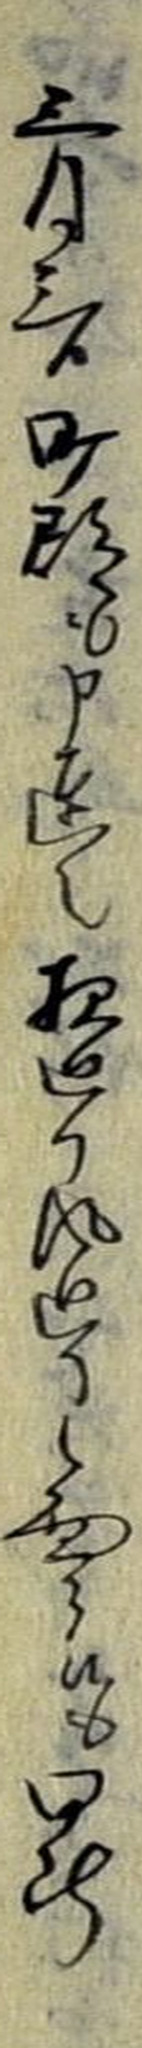三月三日町郡へも申達之夜廻り風廻り之面々江も同断
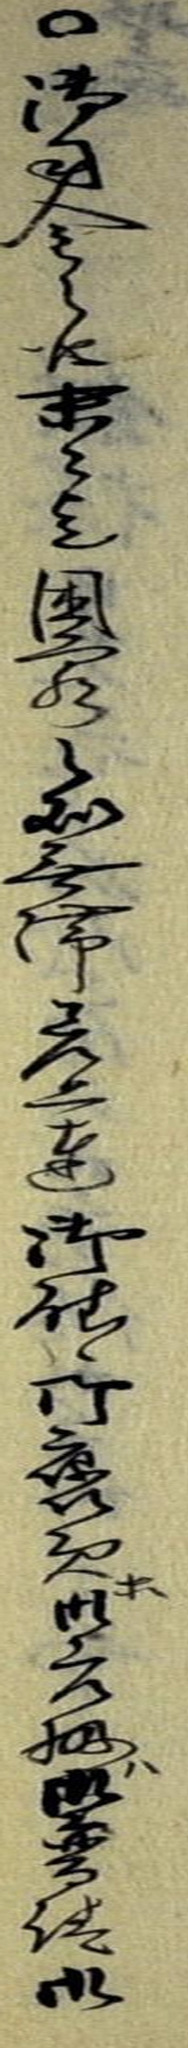〇御用金之儀末々迄困窮之処無滞差上達御聴候御褒美等御取扱ハ御普請御
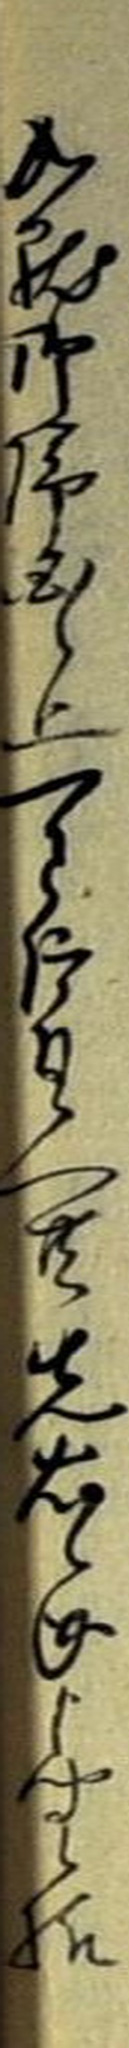成就御帰国之上可被仰付候へ共先右之趣申聞候様
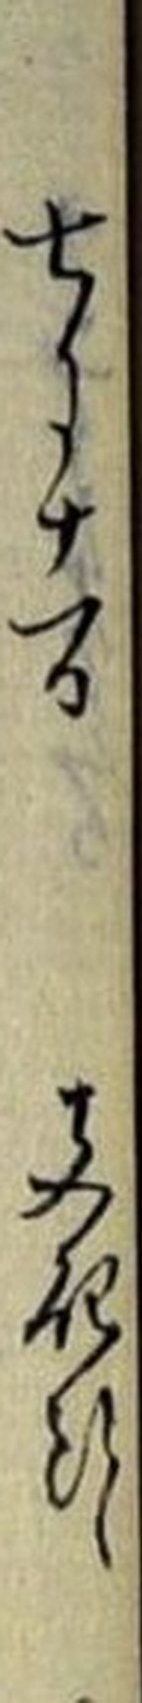七月十一日支配頭へ
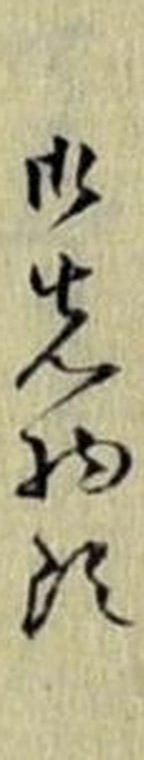御先物頭
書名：命令之部 一
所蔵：福井県文書館 Fukui Prefectural Archives
